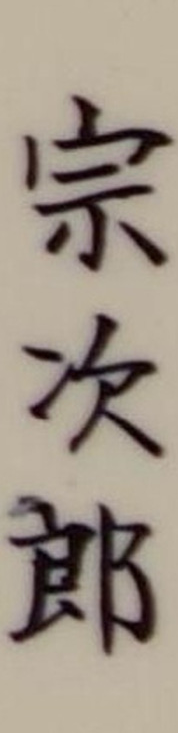宗次郎
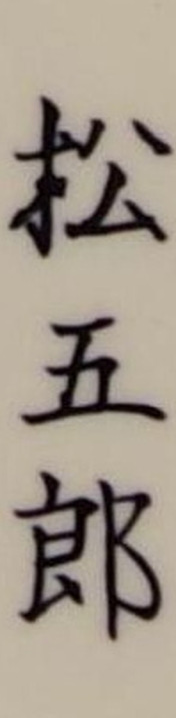松五郎
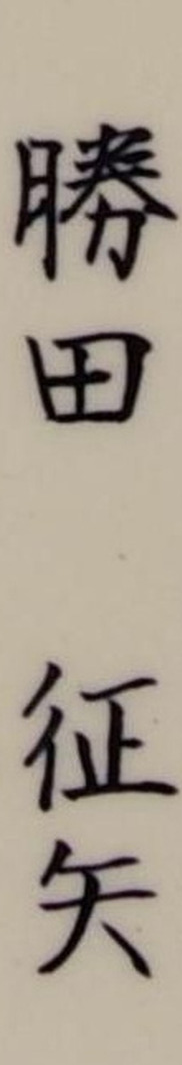勝田征矢
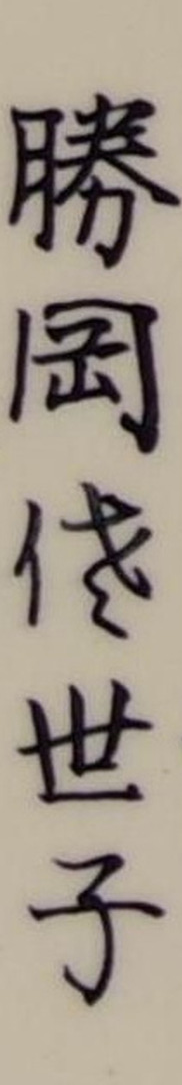勝岡佐世子
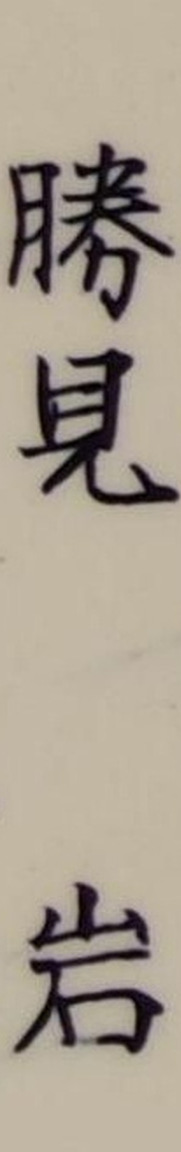勝見岩
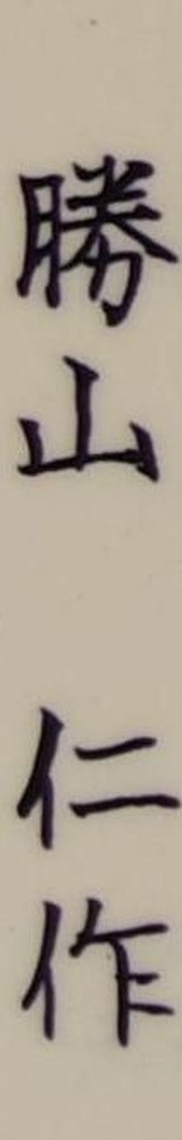勝山仁作
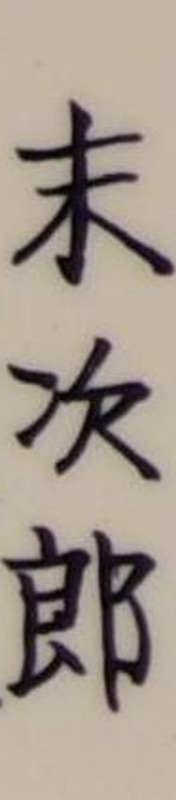末次郎
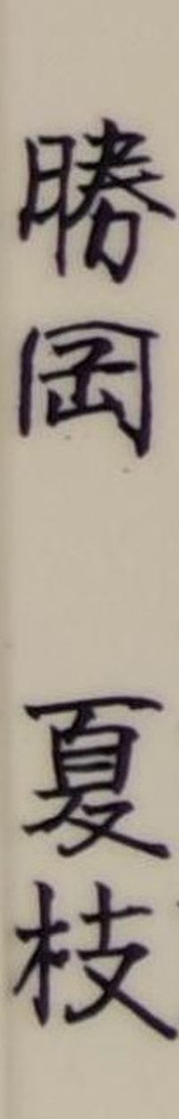勝岡夏枝

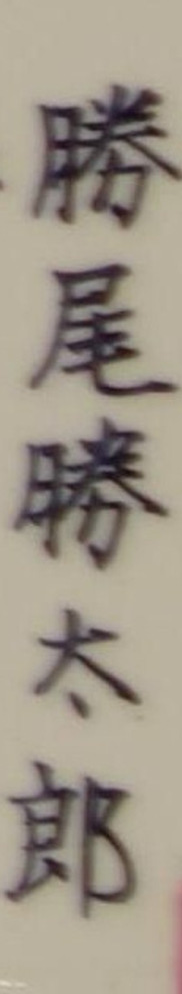勝尾勝太郎
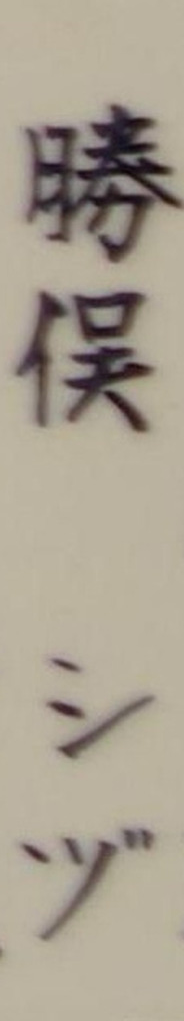勝俣シヅ
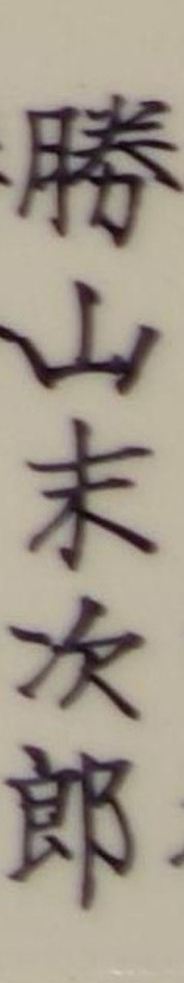勝山末次郎
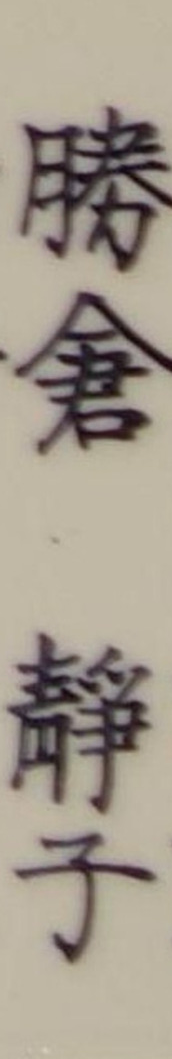勝倉静子
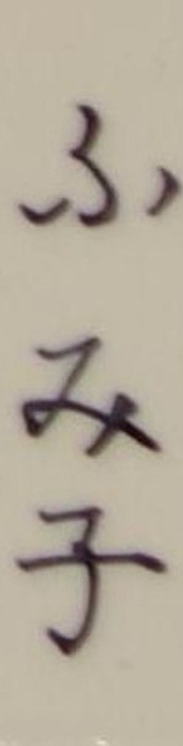ふみ子
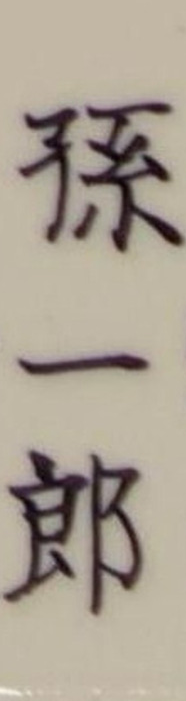孫一郎
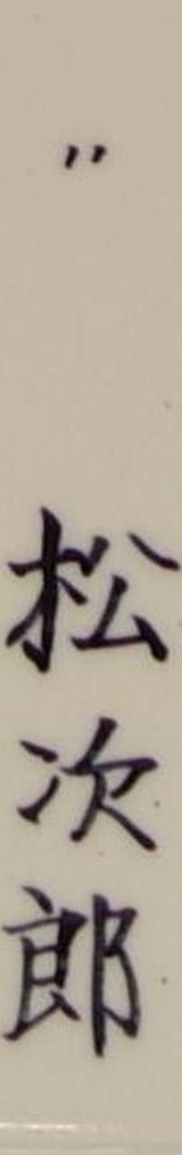松次郎
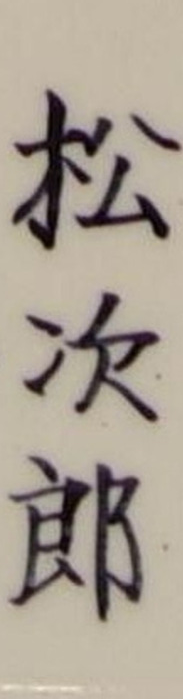松次郎
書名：M~S
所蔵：高野山金剛峯寺
